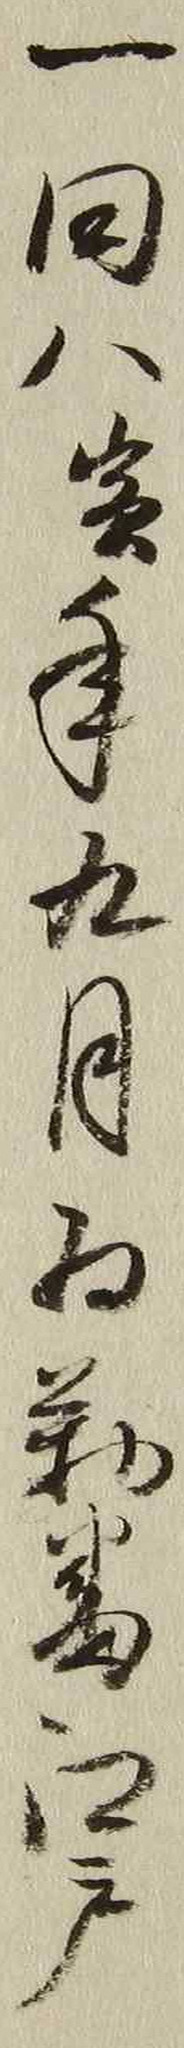一同八寅年九月為勤番江戸
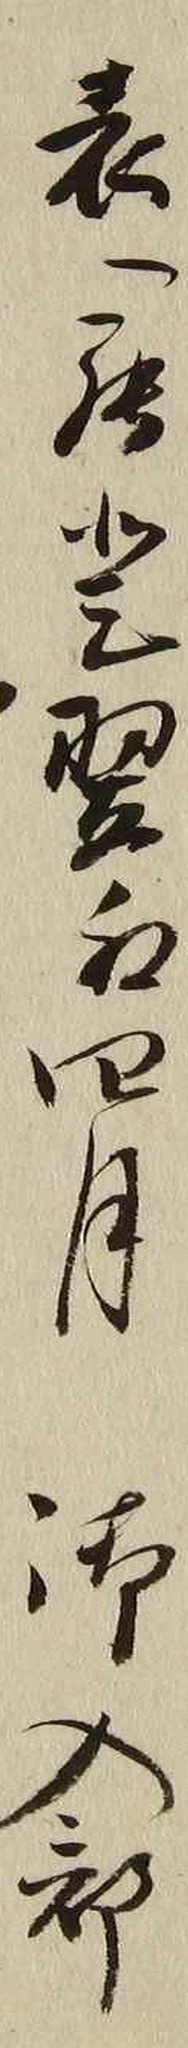表へ罷登翌卯四月御入部
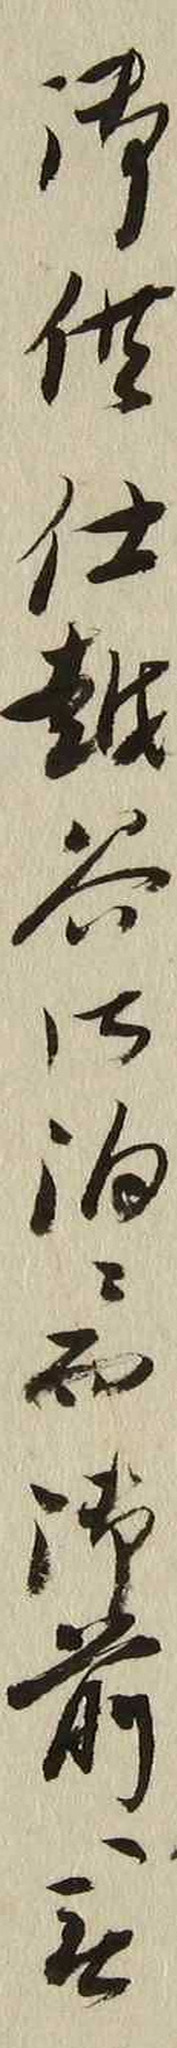御供仕越谷御泊ニ而御前へ被
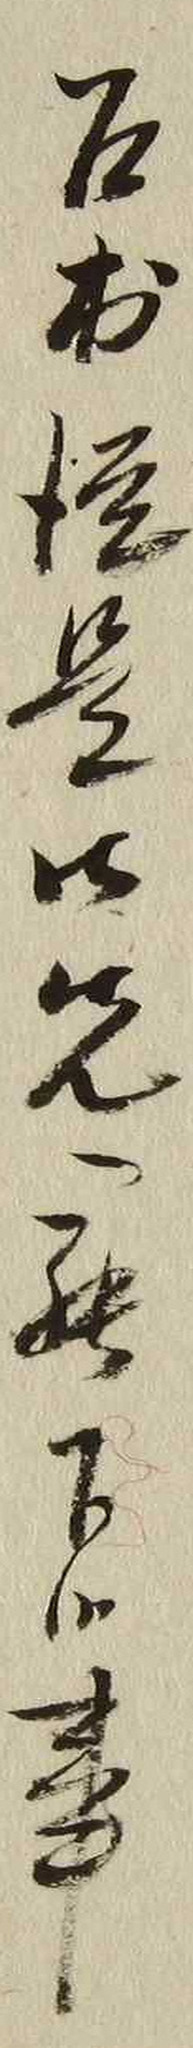召出従是御先へ罷下候事
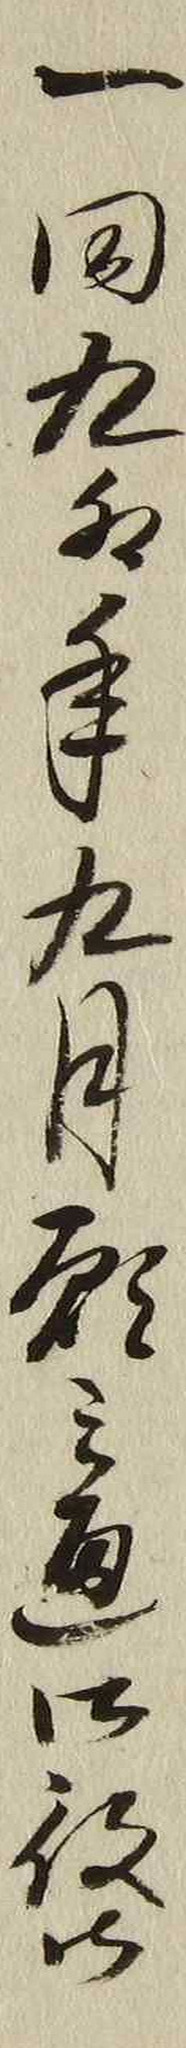一同九卯年九月願之通御役御
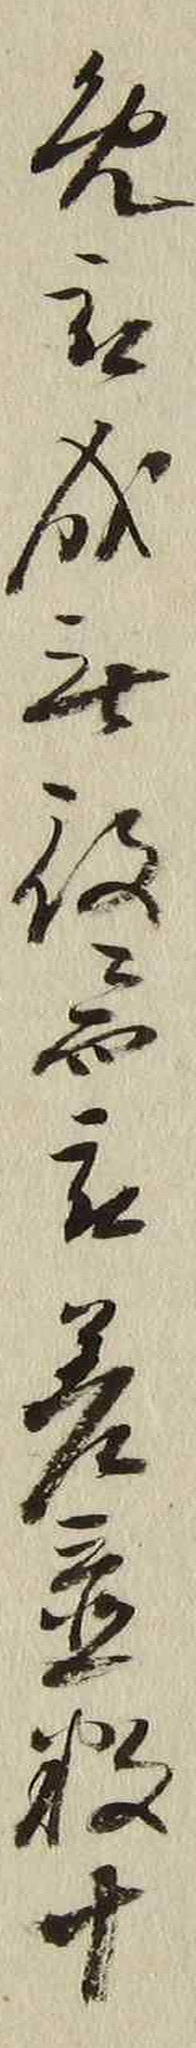免被成無役ニ而被差置数十
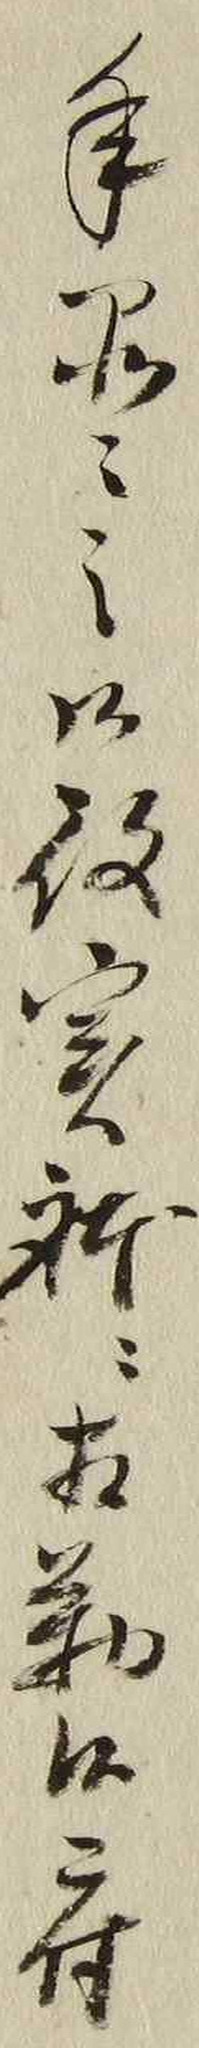年品々之御役実体ニ相勤候ニ付
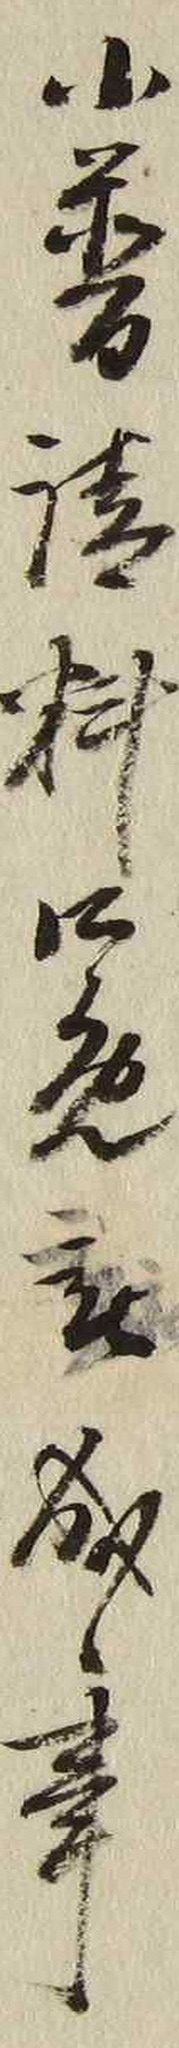小普請料御免被成候事
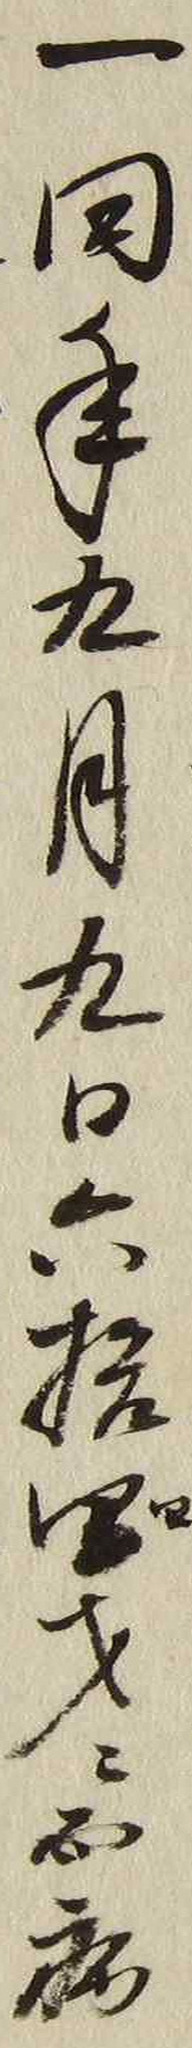一同年九月九日六拾四才ニ而病
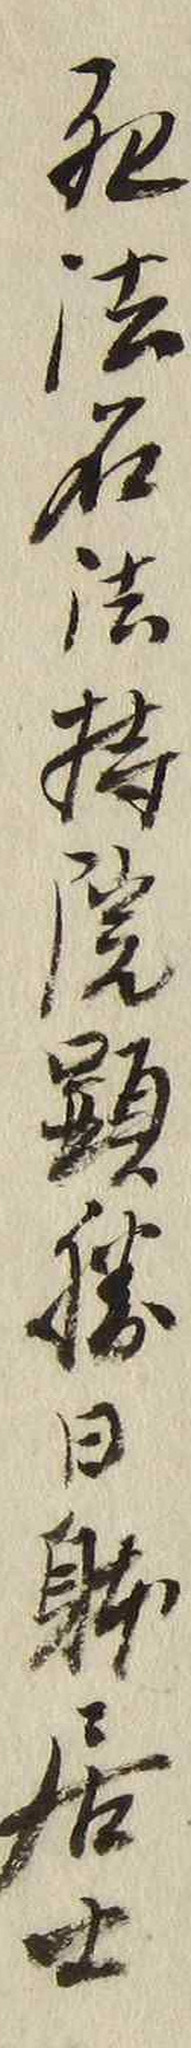死法名法持院顕勝日体居士
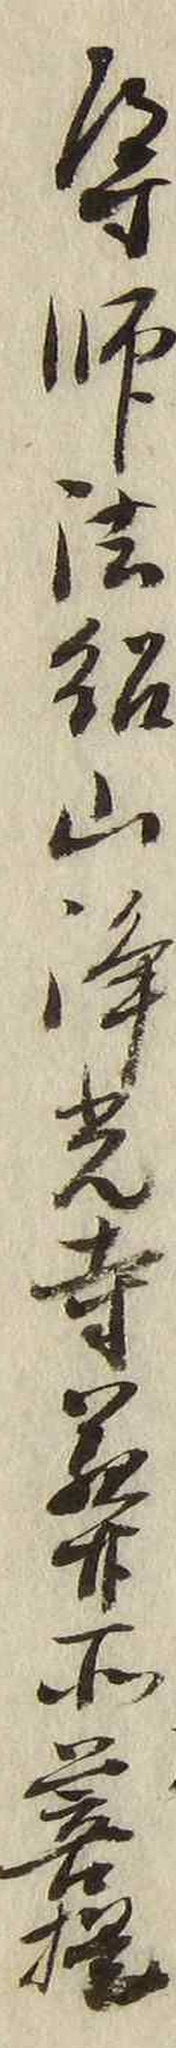導師法紹山浄光寺葬所菩提

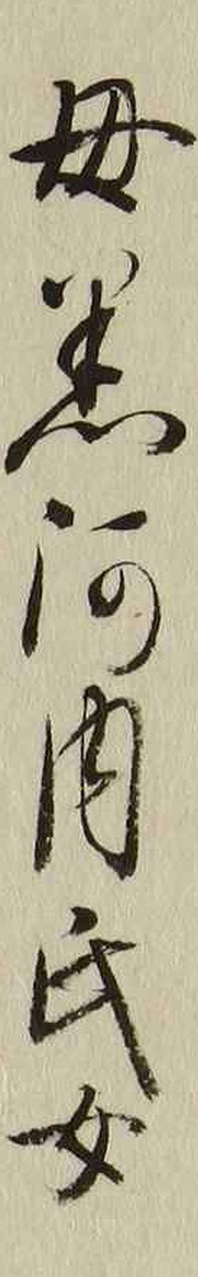母黒河内氏女
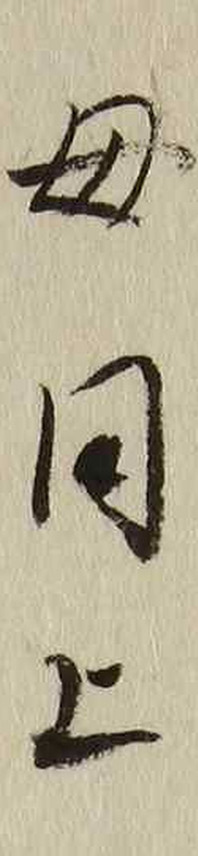母同上
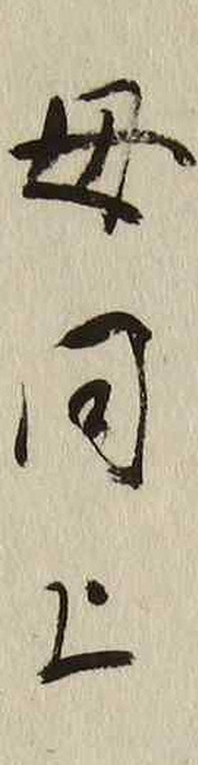母同上
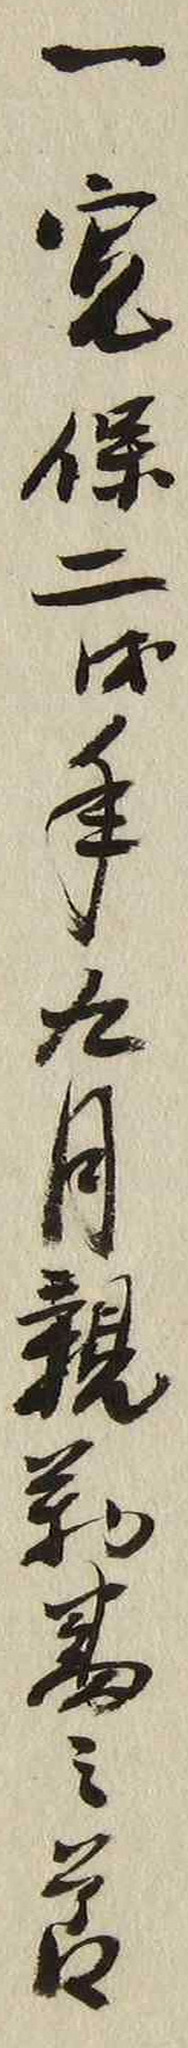一寛保二戌年九月親勤番之節
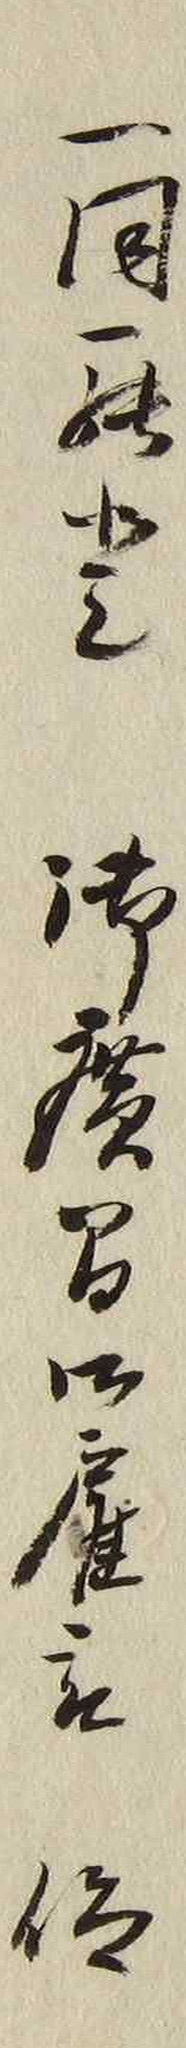一同罷登御広間御雇被仰
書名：諸士系譜　巻之355　す之部5
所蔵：会津若松市立会津図書館
